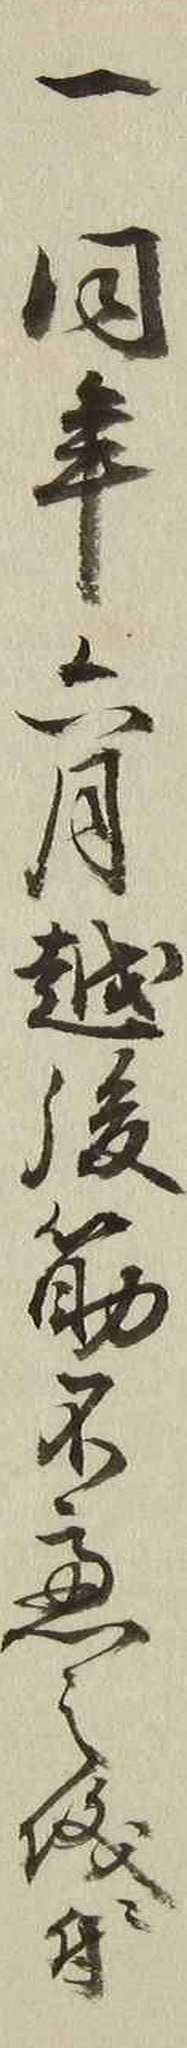一同年六月越後筋不慮之儀ニ付
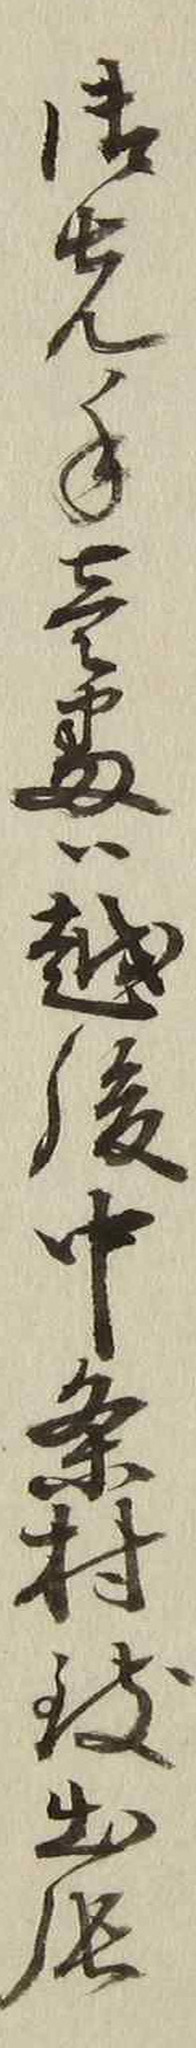御先手壱番ハ越後中条村致出帳
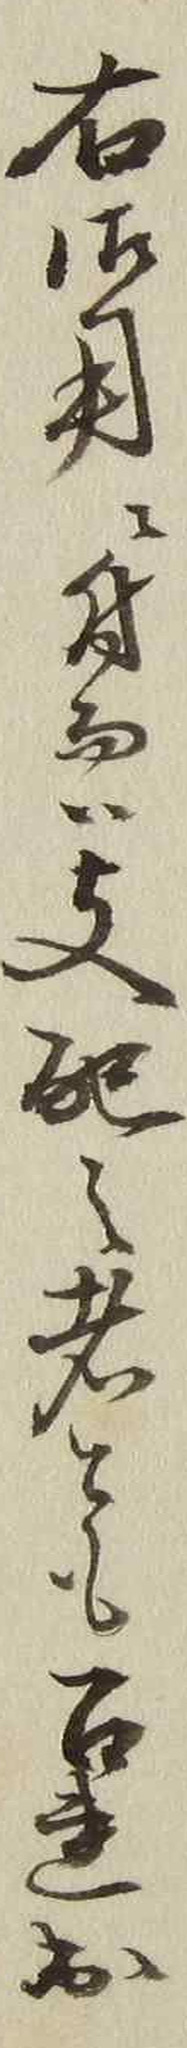右御用ニ付而支ハ支配之者とも召連出
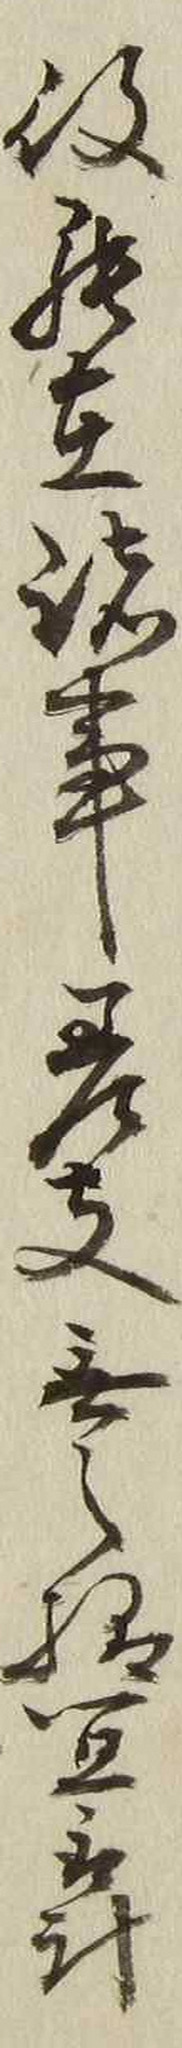役罷在諸事差支無之様宜取計
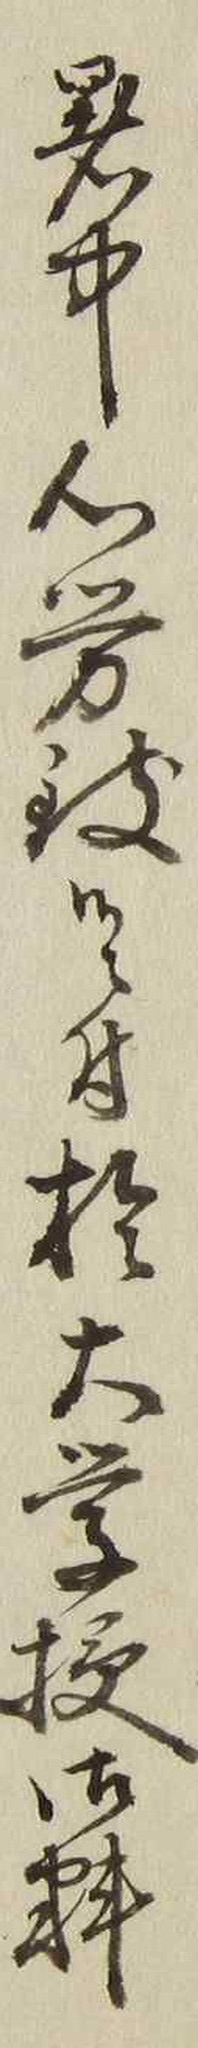暑中心労致候ニ付於大学授御料
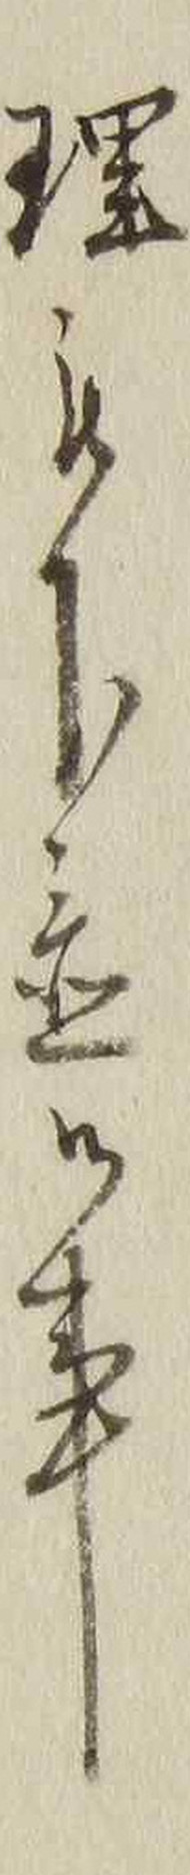理被下置候事
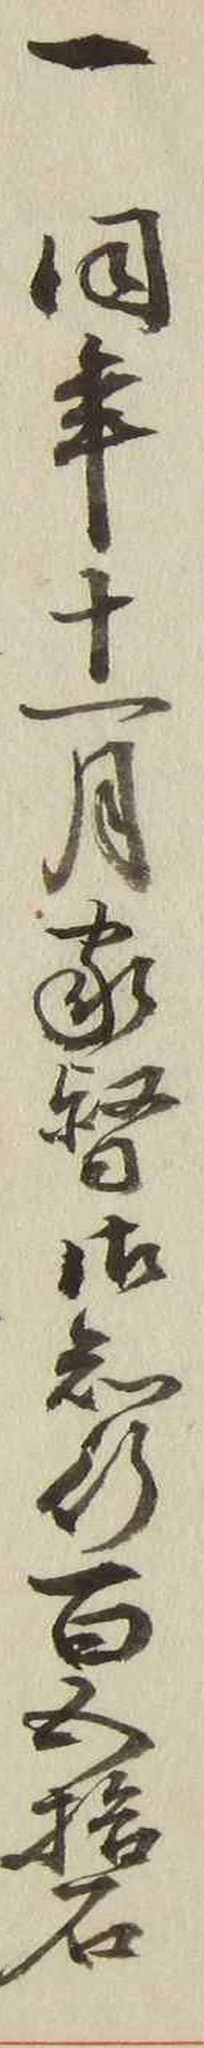一同年十一月家督御知行百五拾石
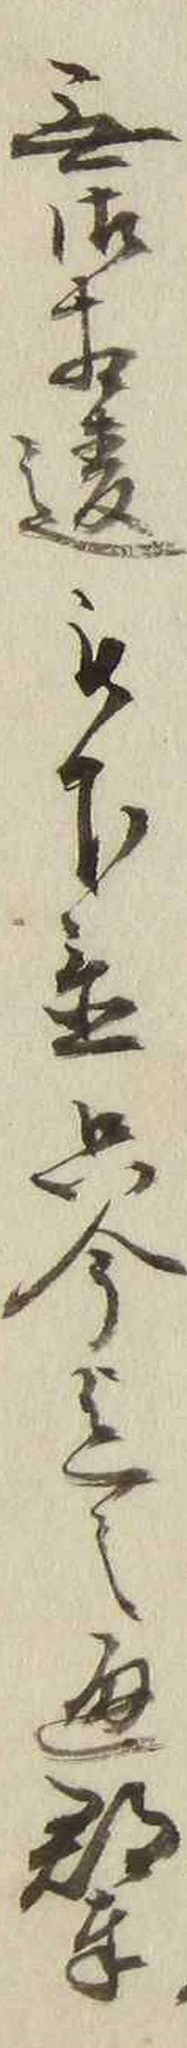無御相違被下置只今迄之通郡奉

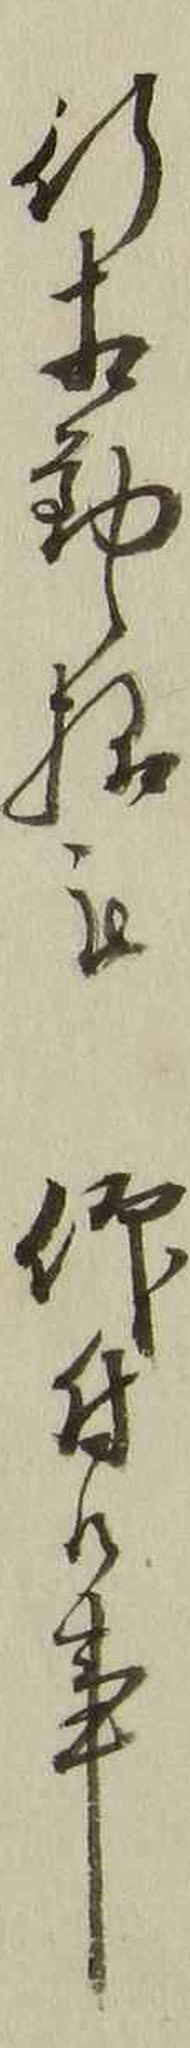行相勤候様被仰付候事
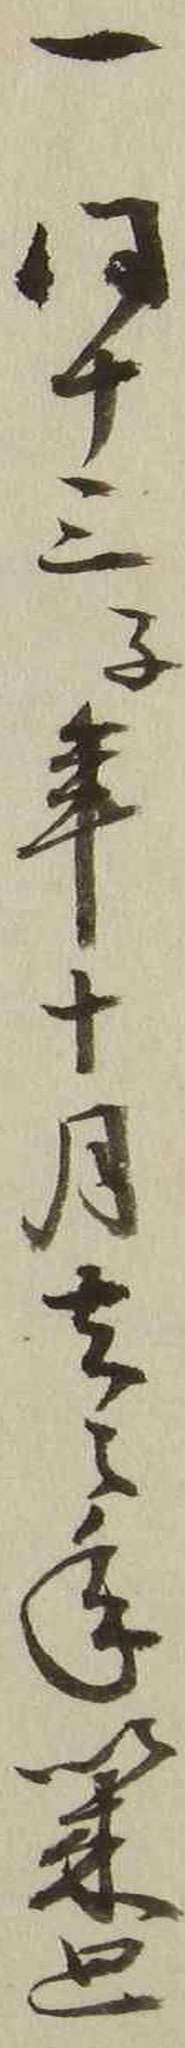一同十三子年十月去々年以来廻
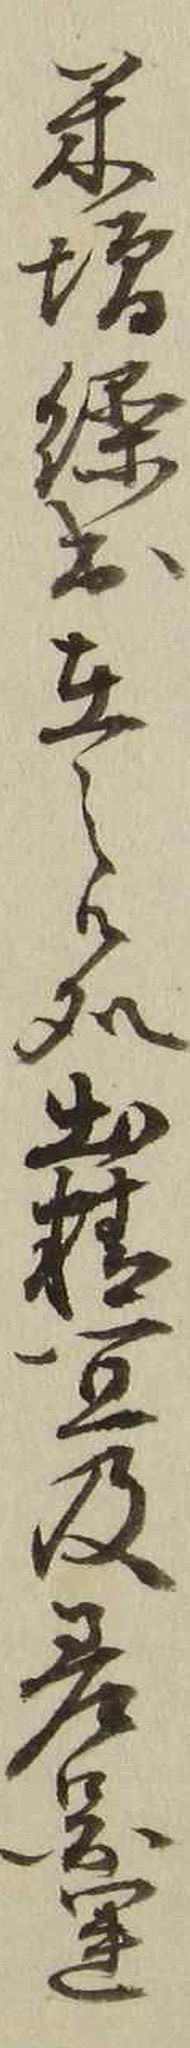米増繰出在之候処出精宜及差図運
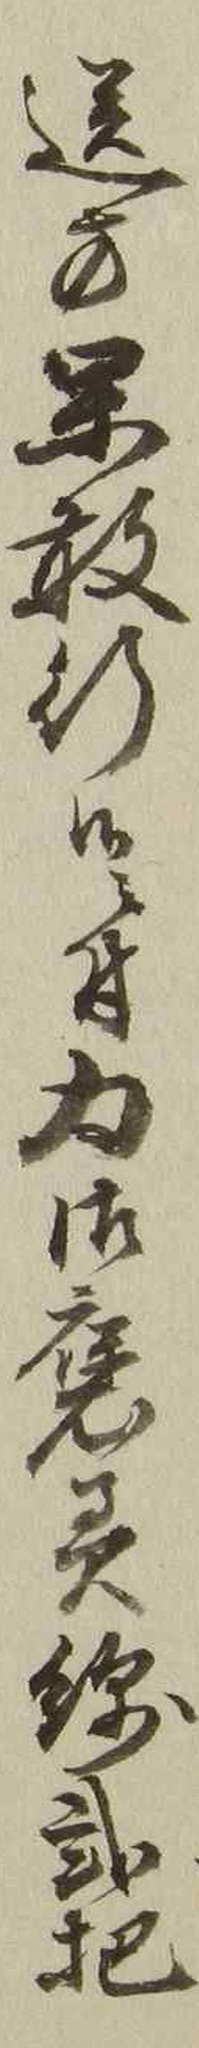送方果敢行候ニ付為御褒美綿弐把
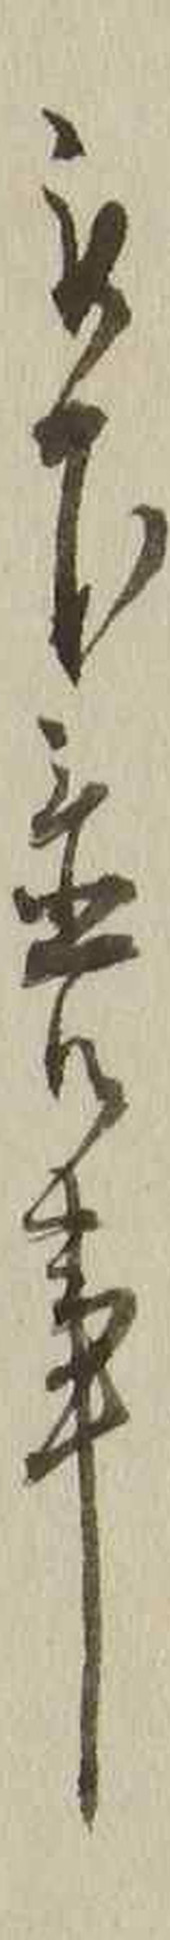被下置候事
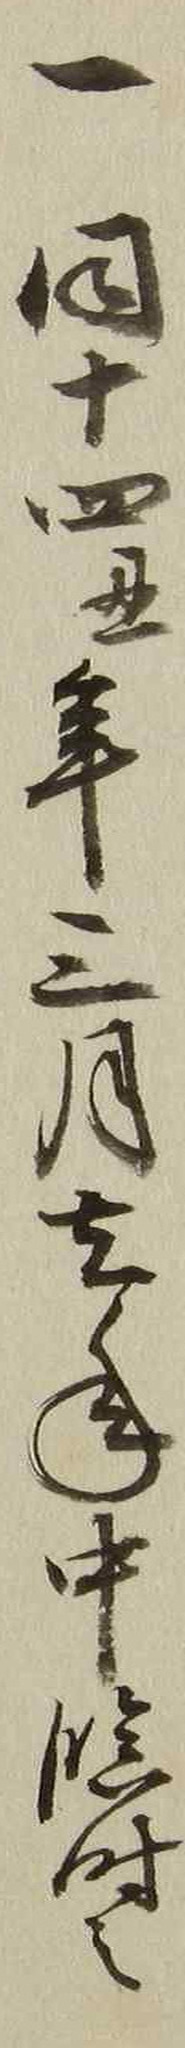一同十四丑年三月去年中臨時之
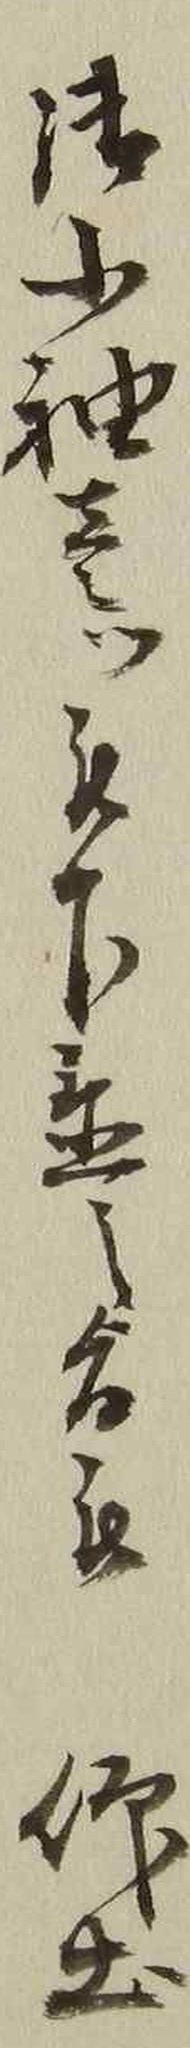御小袖壱ツ被下置之旨被仰出
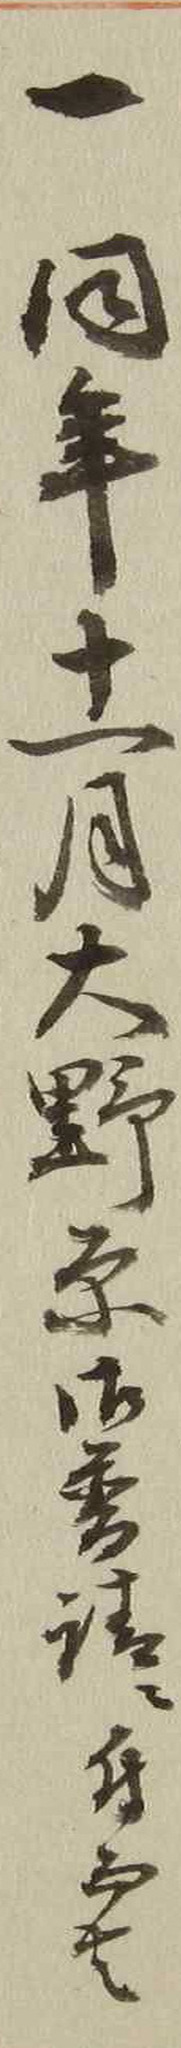一同年十一月大野原御普請ニ付而者
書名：諸士系譜　巻之23　い之部23
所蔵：会津若松市立会津図書館
